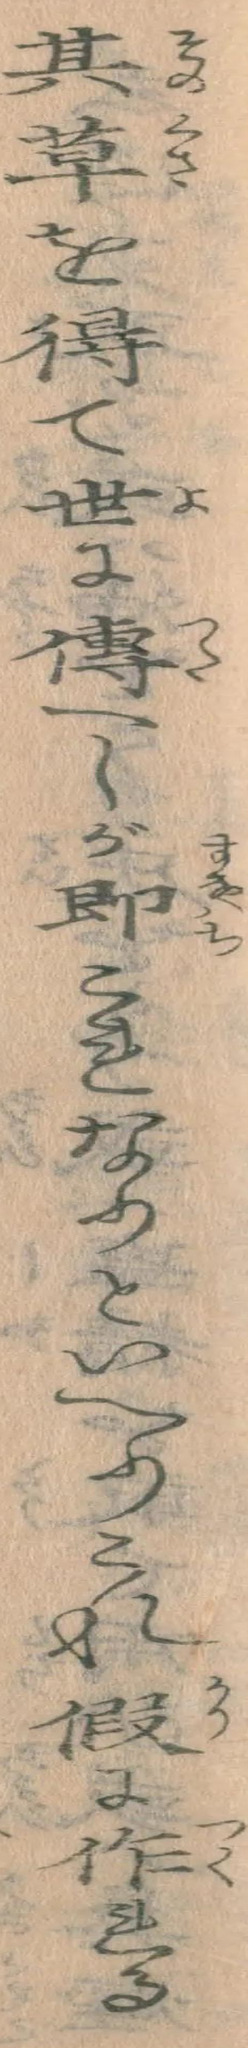其草を得て世に伝へしが即これなりといへりこれ仮に作れる
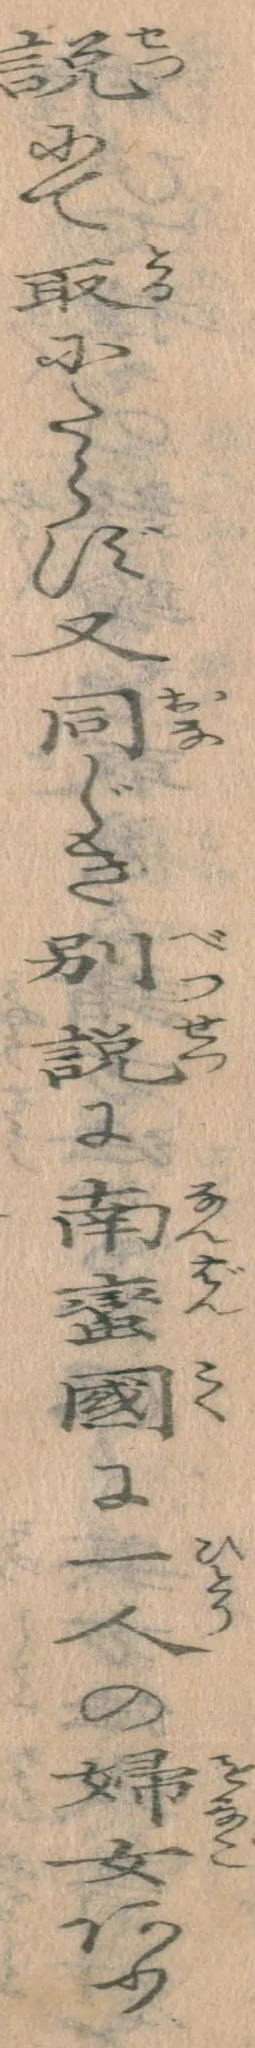説にて取にたらず又同じき別説に南蛮国に一人の婦女あり
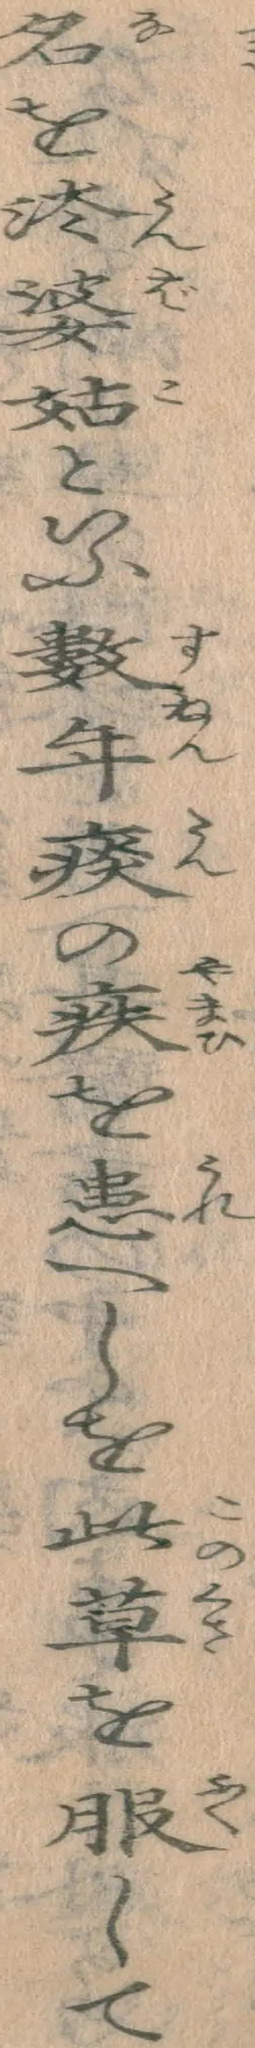名を淡婆姑といふ数年痰の疾を患へしを此草を服して
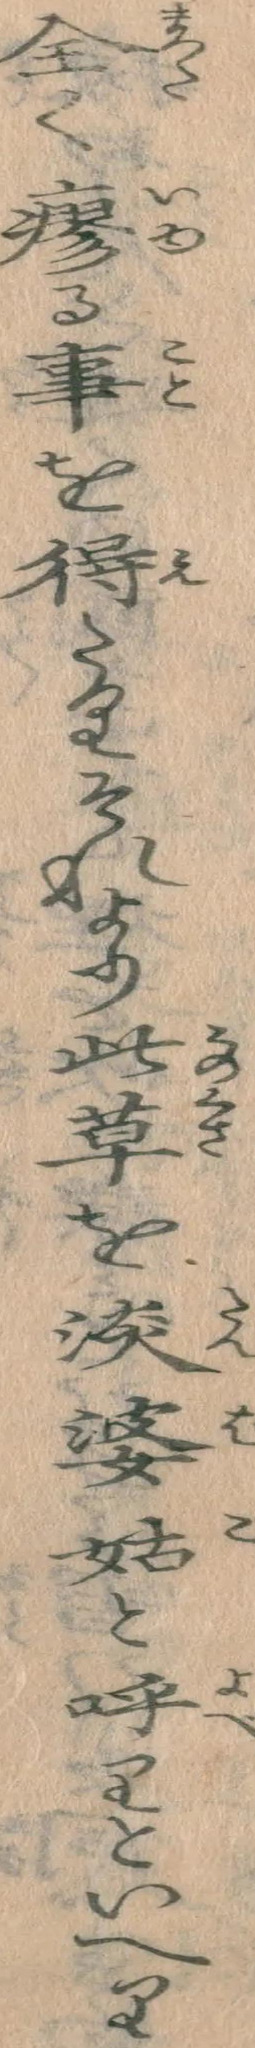全く瘳る事を得たりそれより此草を淡婆姑と呼りといへり
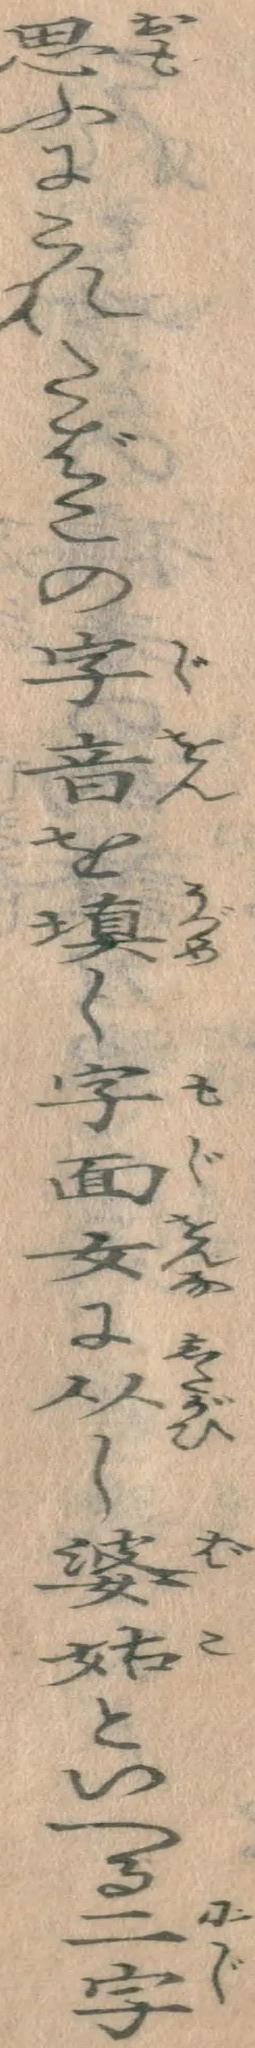思ふにこれたばこの字音を填し字面女に従し婆姑といへる二字
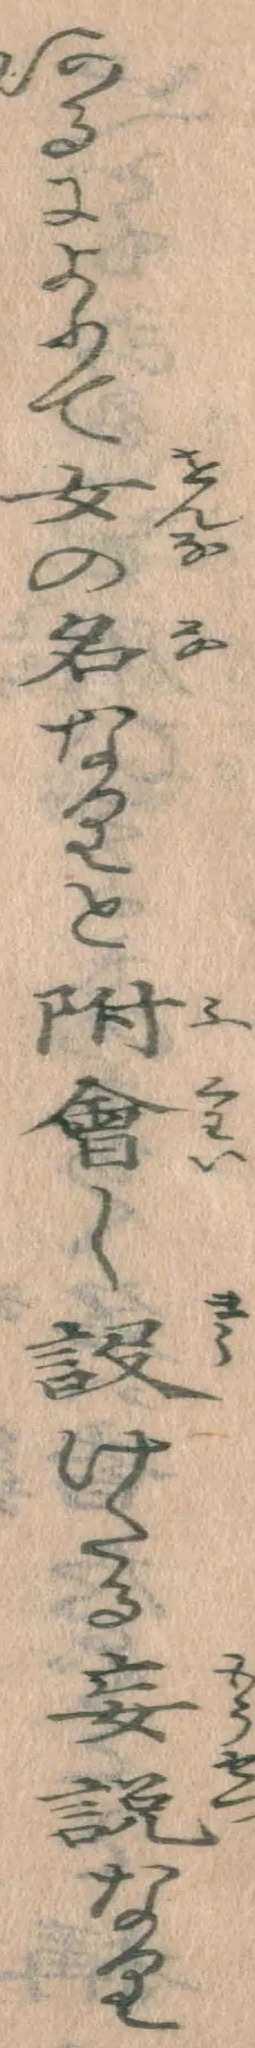あるによりて女の名なりと附会し設けたる妄説なり
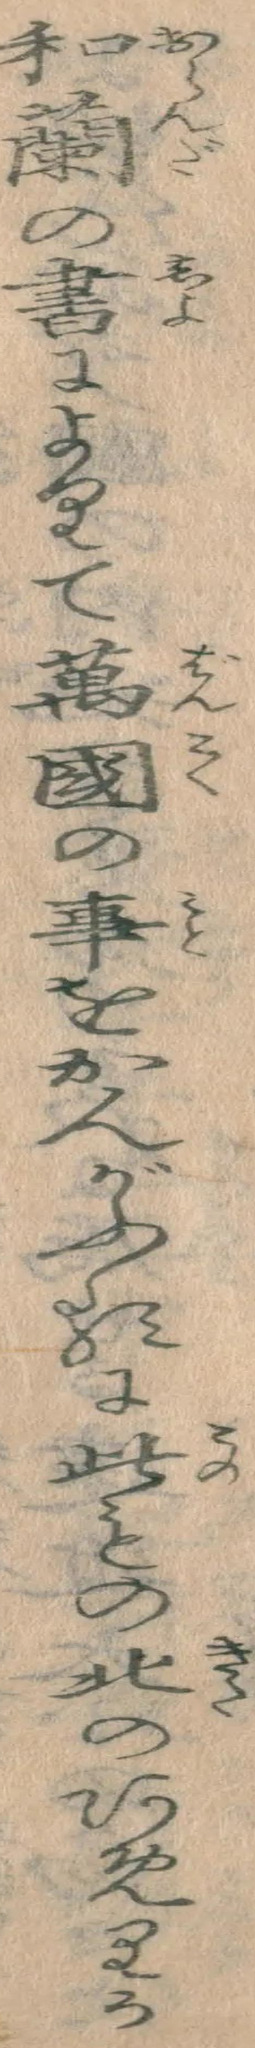和蘭の書によりて万国の事をかんがふるに此もの北のあめりか
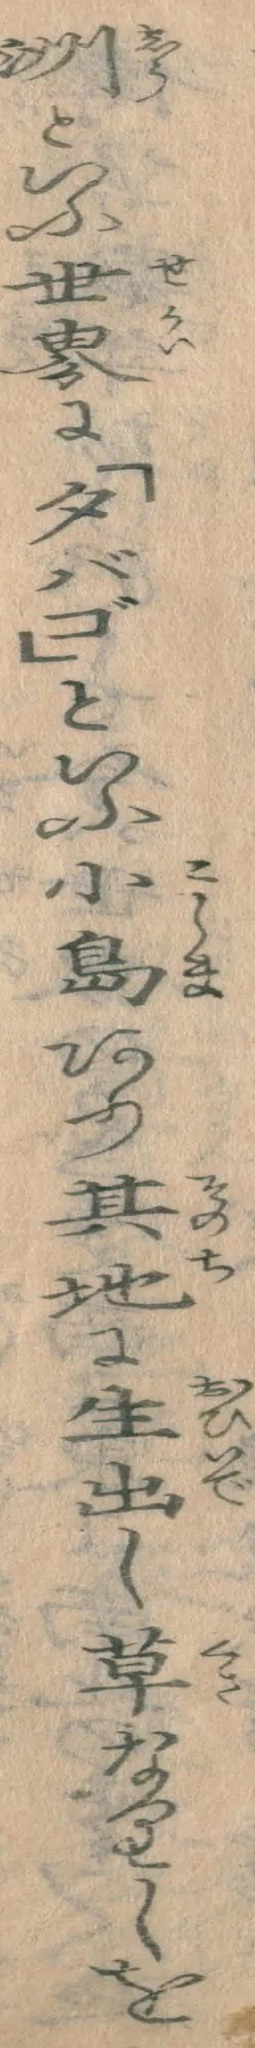洲といふ世界に「タバゴ」といふ小島あり其地に生出し草なりしを
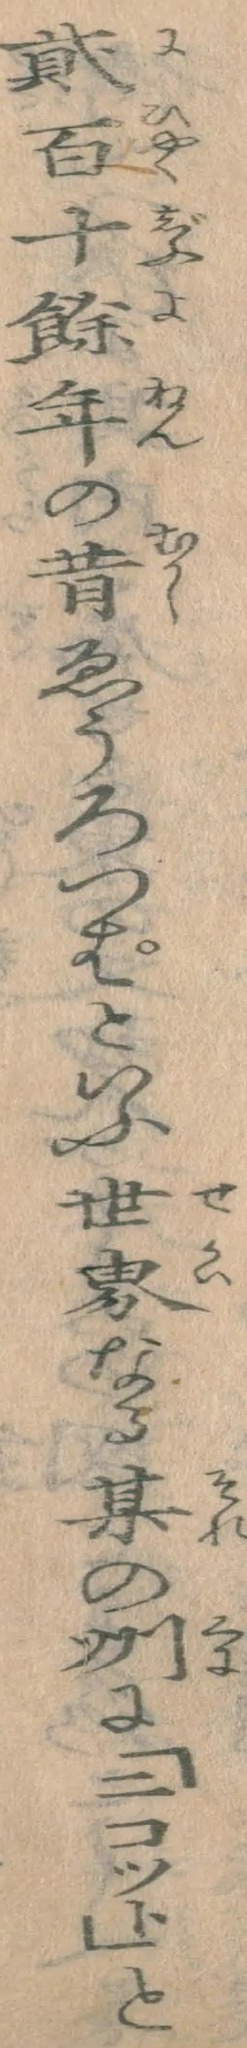弐百十余年の昔ゑうろつぱといふ世界なる某の州に「ニコツト」と
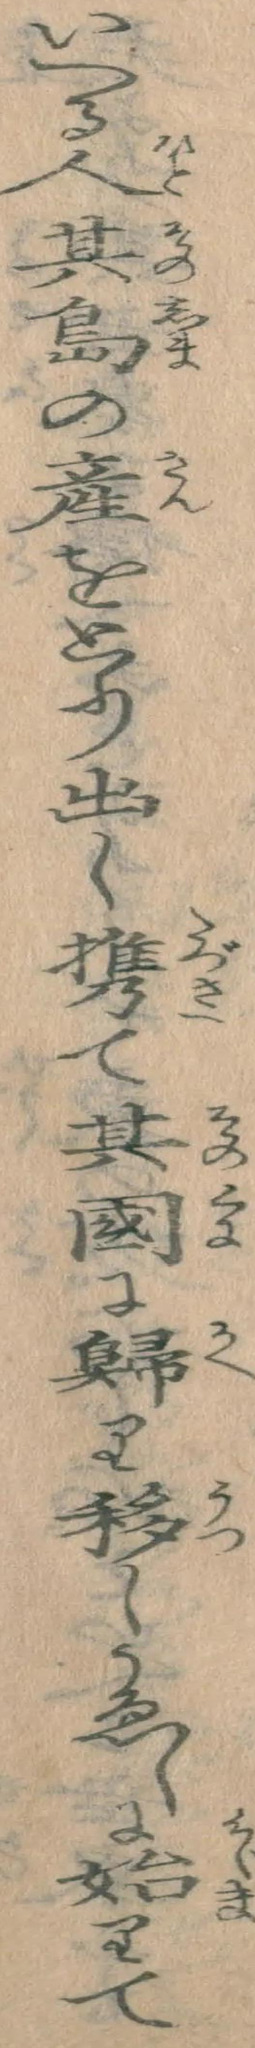いへる人其島の産をとり出し携て其国に帰り移しうゑしに始りて

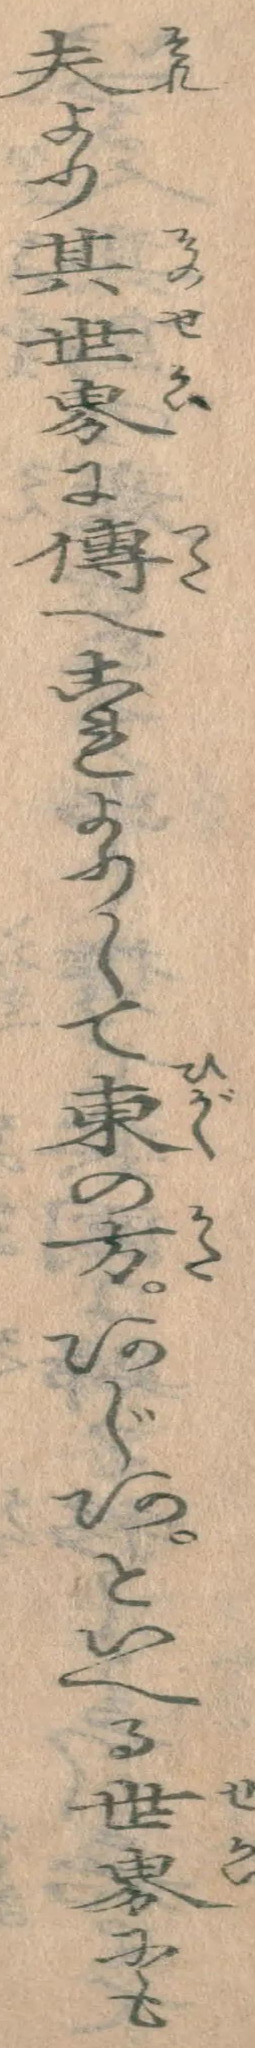夫より其世界に伝へこれよりして東の方。あじあ。といへる世界にも
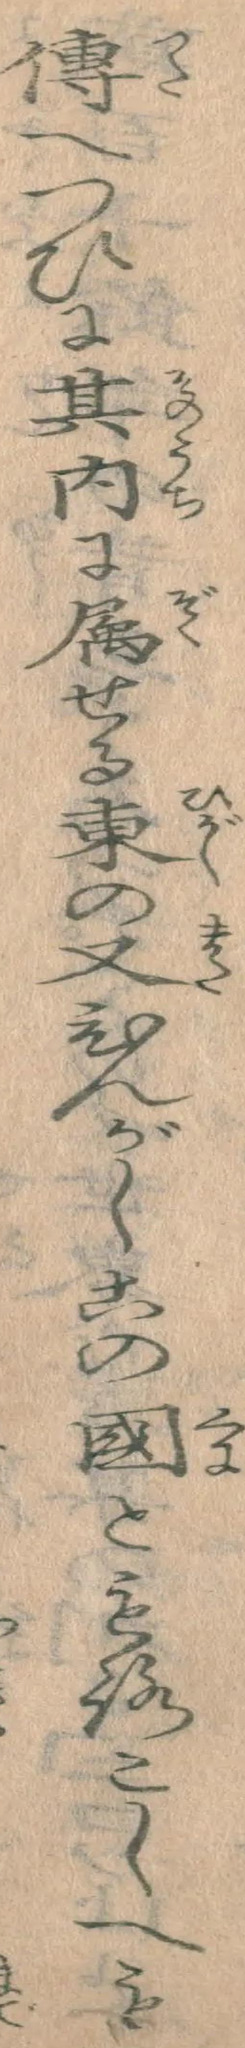伝へつひに其内に属せる東の又ひんがしこの国ともろこしへも
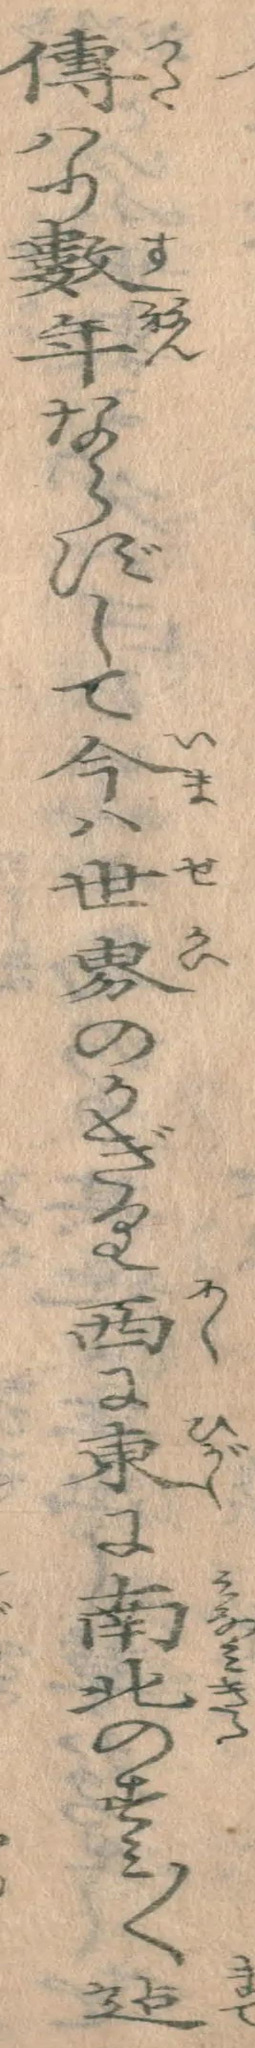伝はり数年ならずして今は世界のかぎり西に東に南北のすみ〳〵迠
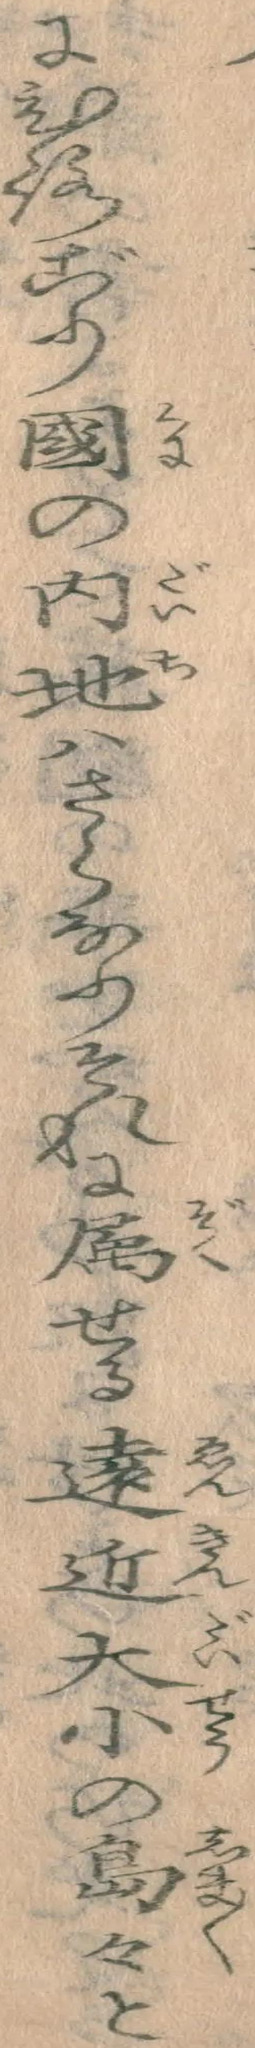にひろごり国の内地はさらなりそれに属せる遠近大小の島々と
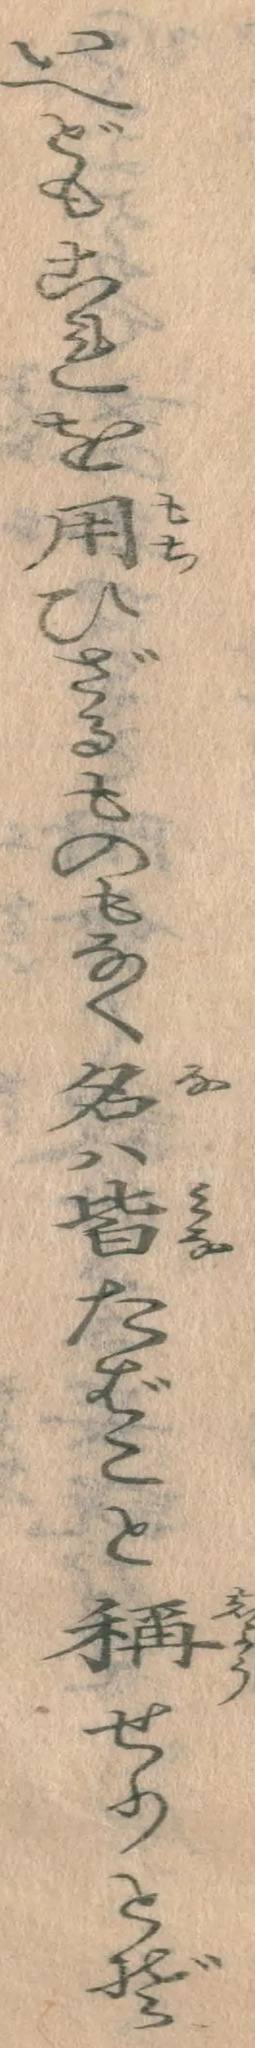いへどもこれを用ひざるものもなく名は皆たばこと称せりとぞ
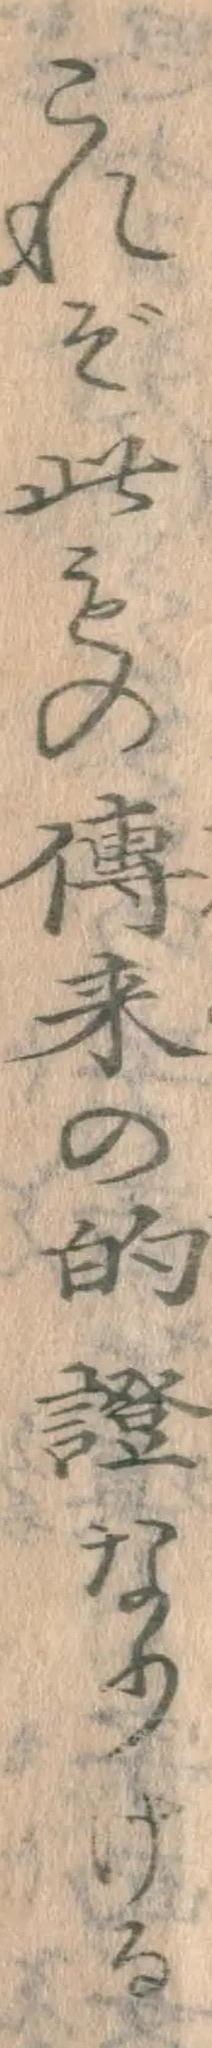これぞ此もの伝来の的証なりける
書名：目さまし草
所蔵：国立国会図書館 National Diet Library, JAPAN
